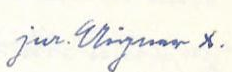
jur. Aigner X
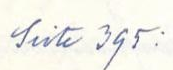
Seite395:
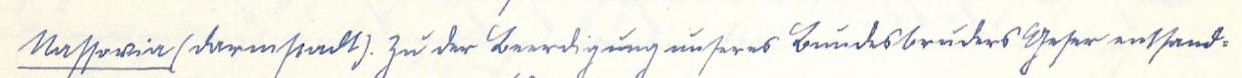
Nassowia (Darmstadt). Zu der Beerdigung unseres Bundesbruders Geser entsand-
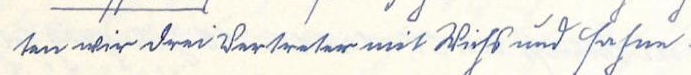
ten wir drei Vertreter mit Wichs und Fahne….
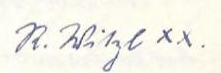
R. Witzl XX
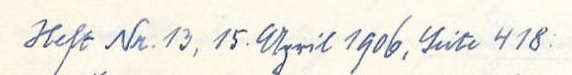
Heft Nr. 13, 15. April 1906, Seite 418:
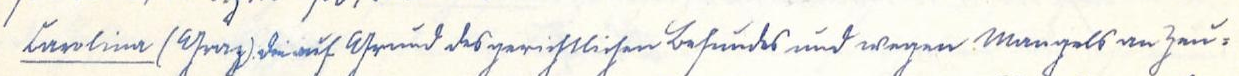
Carolina (Graz). Die auf Grund des gerichtlichen Befunds und wegen Mangels an Zeu-
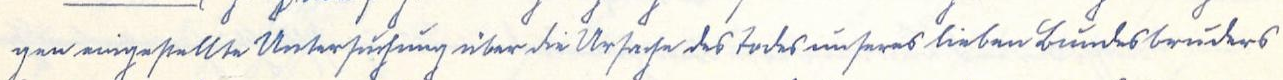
gen eingestellte Untersuchung über die Ursache des Todes unseres lieben Bundesbruders
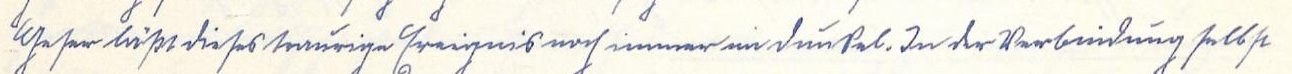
Geser läßt dieses traurige Ereignis noch immer im Dunkel. In der Verbindung selbst
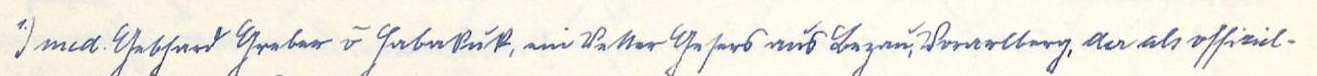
1) med. Gebhard Greber v/o Habakuk, ein Vetter Gesers aus Bezau, Vorarlberg, der als offiziel-
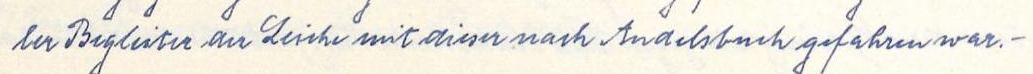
ler Begleiter der Leiche mit dieser nach Andelsbuch gefahren war.
